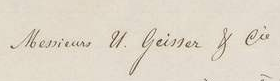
Messieurs U. Geisser & Cie
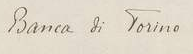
Banca di Torino
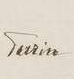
Turin
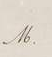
M.
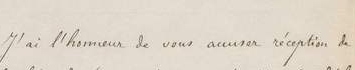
J'ai l'honneur de vous accuser réception de
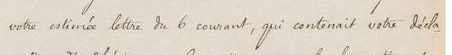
votre estimée lettre du 6 courant, qui contenait votre décla-
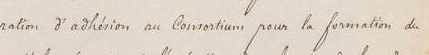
ration d'adhésion au Consortium pour la formation du
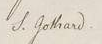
S. Gothard.
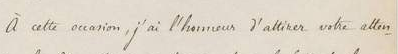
À cette occasion, j'ai l'honneur d'attirer votre atten-
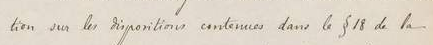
tion sur les dispositions contenues dans le § 18 de la
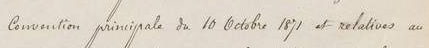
Convention principale du 10 Octobre 1871 et relatives au
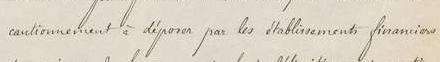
cautionnement à déposer par les établissements financiers
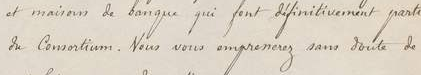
du Consortium. Vous vous empresserez sans doute
